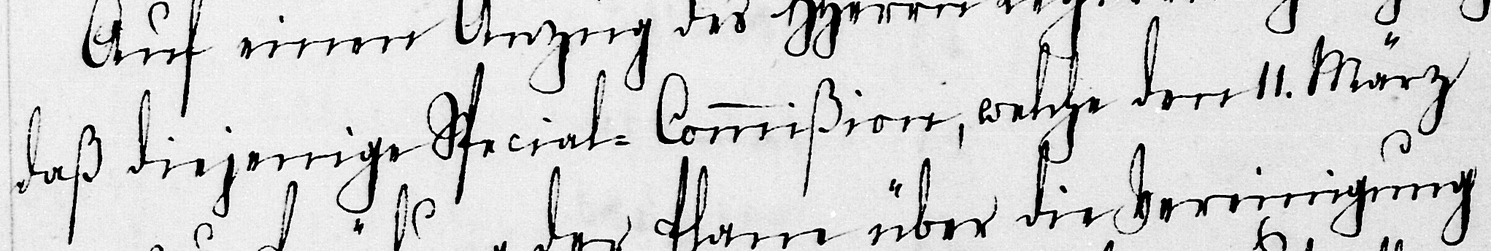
daß diejenige Special-Commißion, welche den 11. März
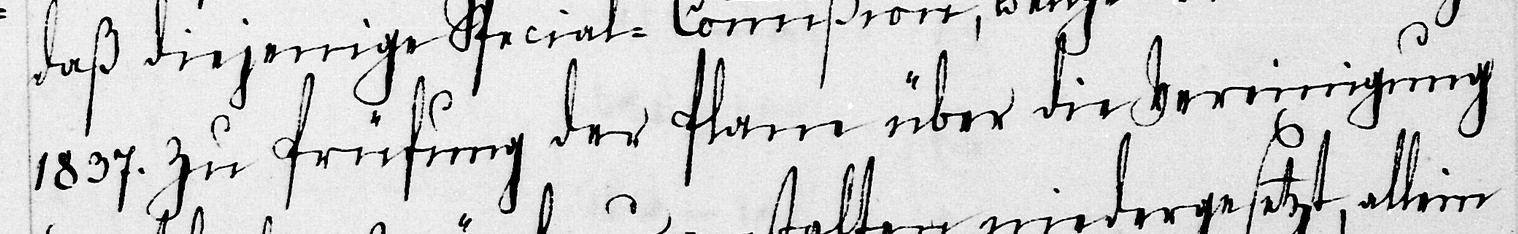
1837. zu Prüfung der Plane über die Vereinigung
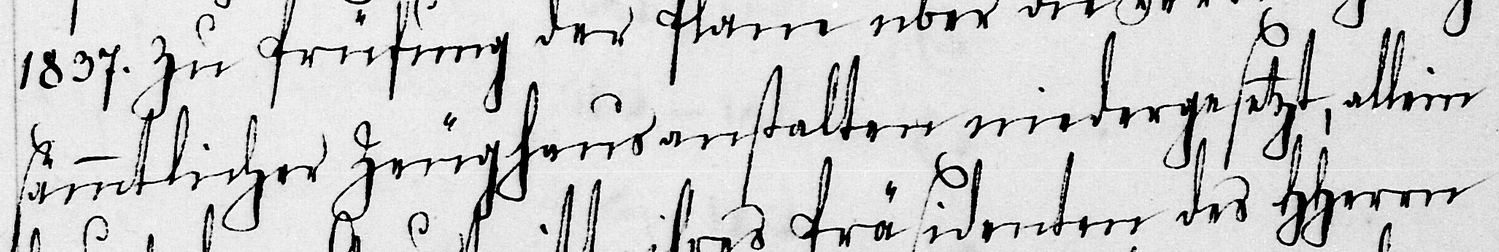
sämmtlicher Zeughausanstalten niedergesetzt, alle¬
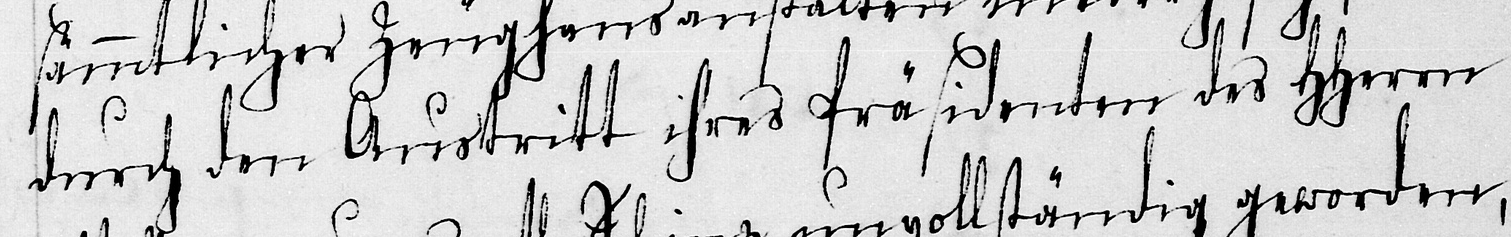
durch den Austritt ihres Präsidenten des HHerrn
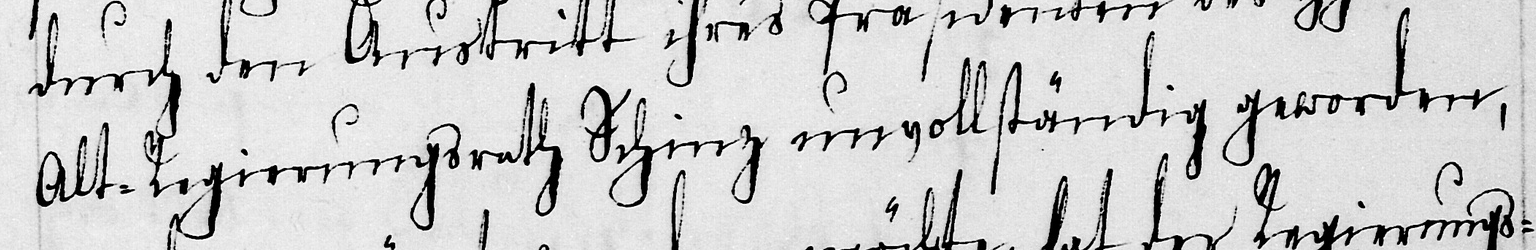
Alt-Regierungsrath Schinz unvollständig geworden,
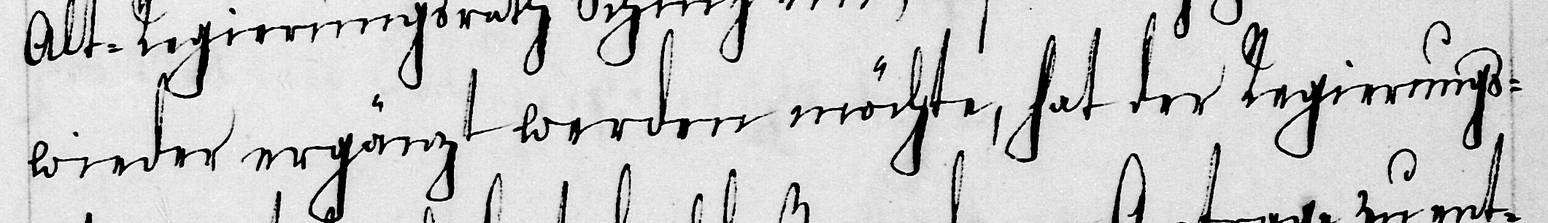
wieder ergänzt werden möchte, hat der Regierungs¬
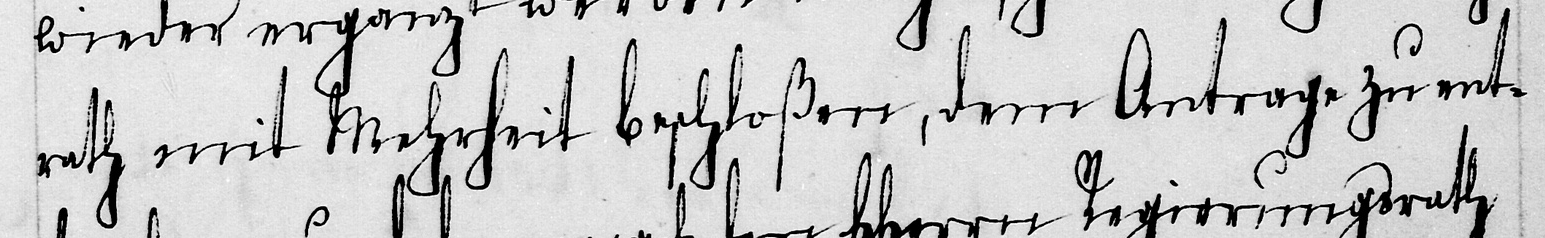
rath mit Mehrheit beschloßen, dem Antrage zu ent¬
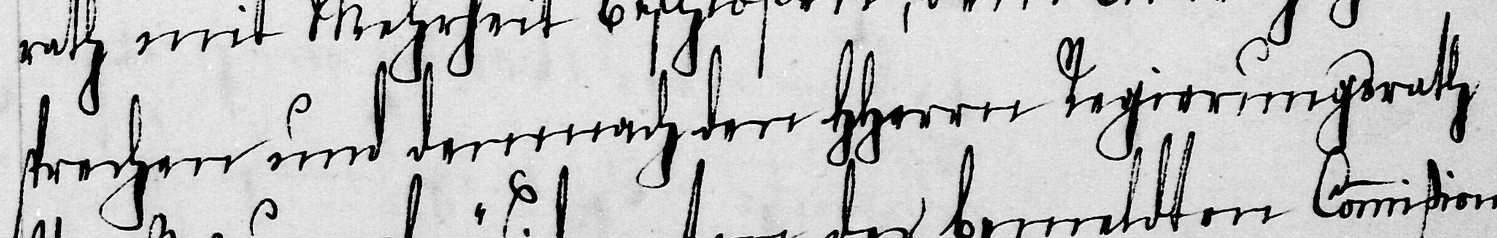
sprechen und demnach den HHerrn Regierungsrath
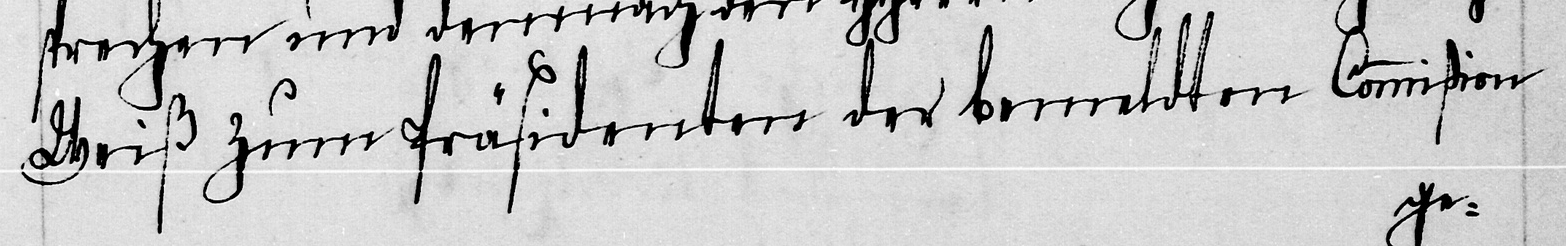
Weiß zum Präsidenten der bemeldten Commißon
